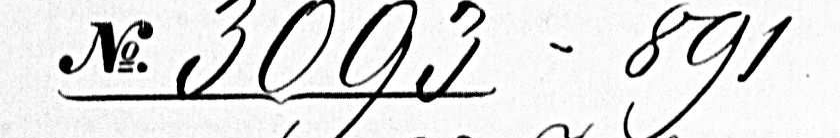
No. 3093 - 1891
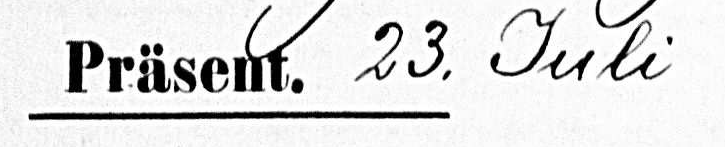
Präsent. 23. Juli
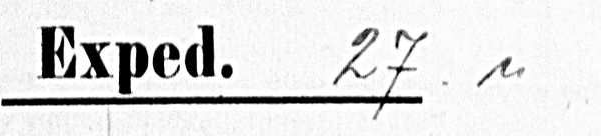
Exped. 27. „
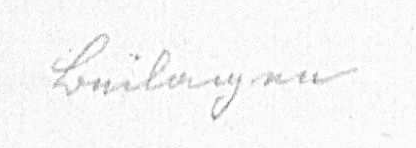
Beilagen
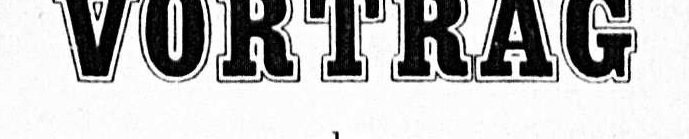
VORTRAG
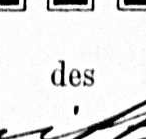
des
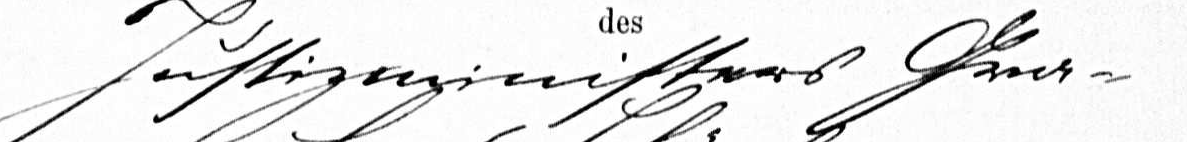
Justizministers Gra¬
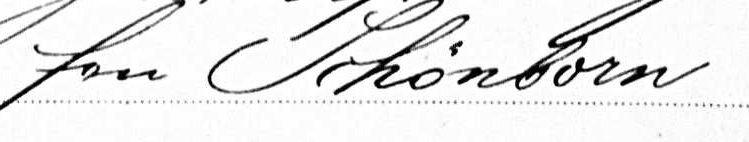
fen Schönborn
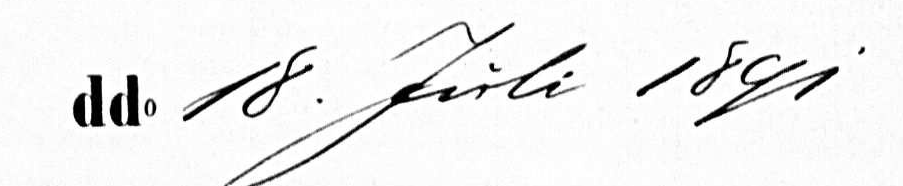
ddo 18. Juli 1891
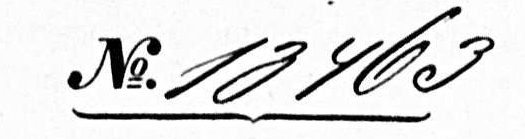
No. 13463
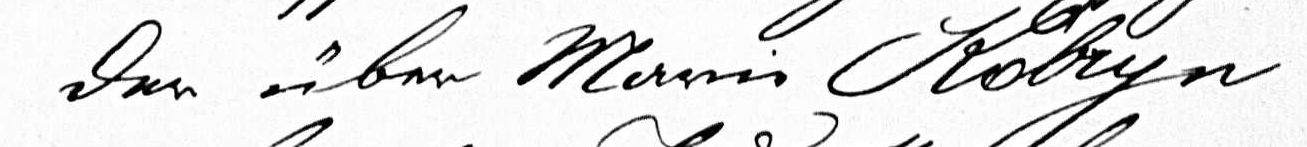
der über Marie Kobryn
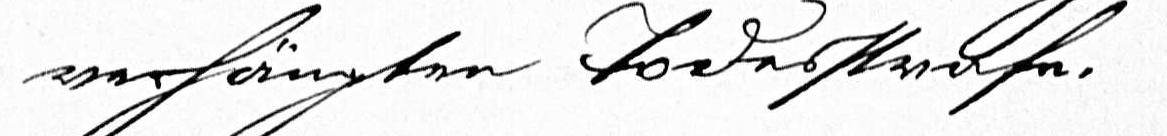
verhängten Todesstrafe.
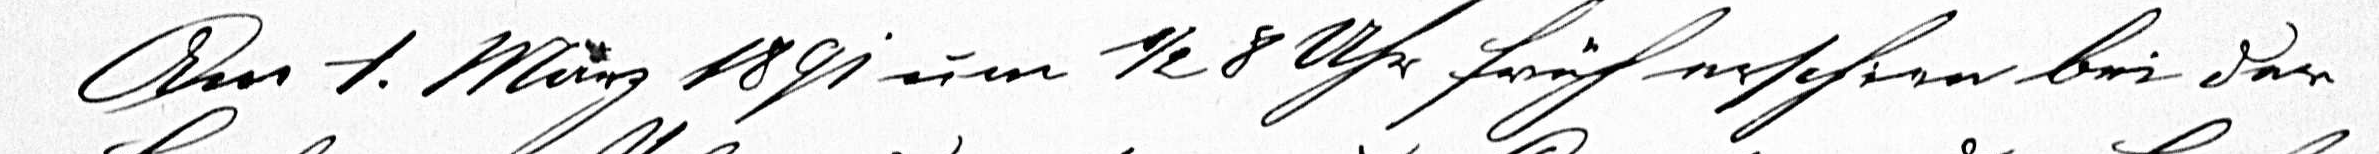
Am 1. März 1891 um ½ 8 Uhr früh erschien bei der
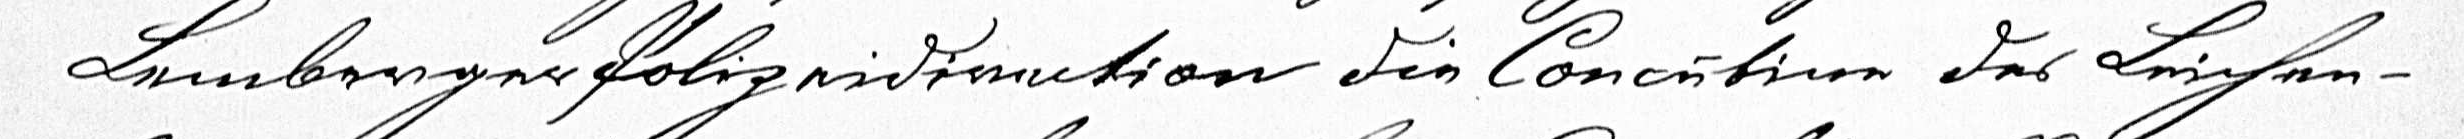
Lemberger Polizeidirection die Concubine des Leichen¬
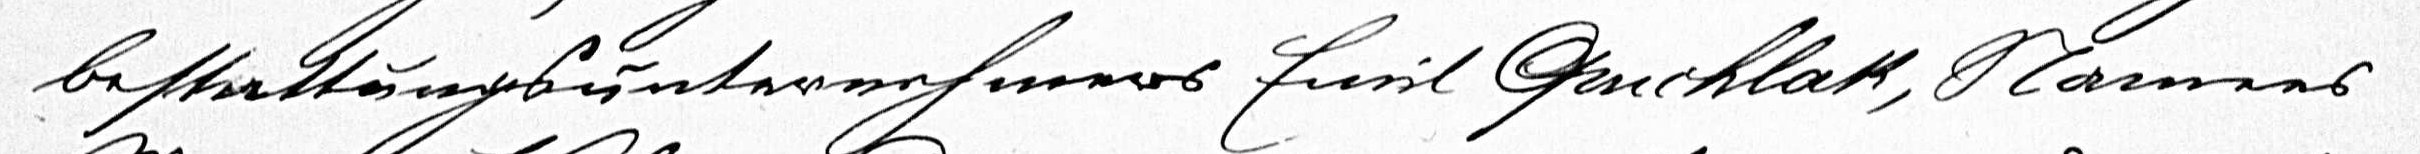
bestellungsunternehmers Emil Opuchlak, Namens
